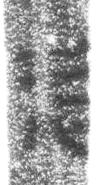君
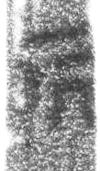而
